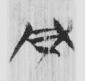凡
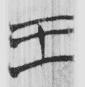王
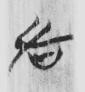左
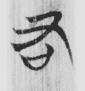右
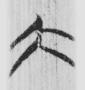大
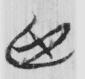臣
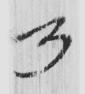乃
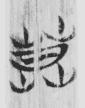莫
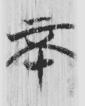不
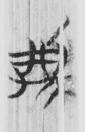{井刀}
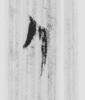人
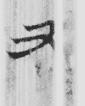又
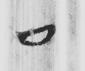厶
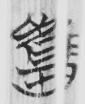{萑田}
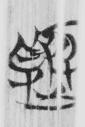𪴿
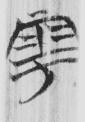𩁹
